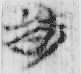苛
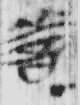善
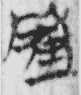○（陳）
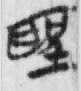聖
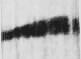一
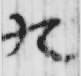九
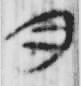月
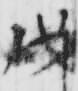戊
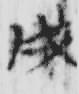戌
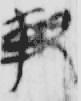○（範）
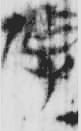{尸拃}（作）
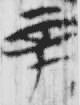辛
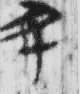丑
